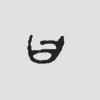曰
